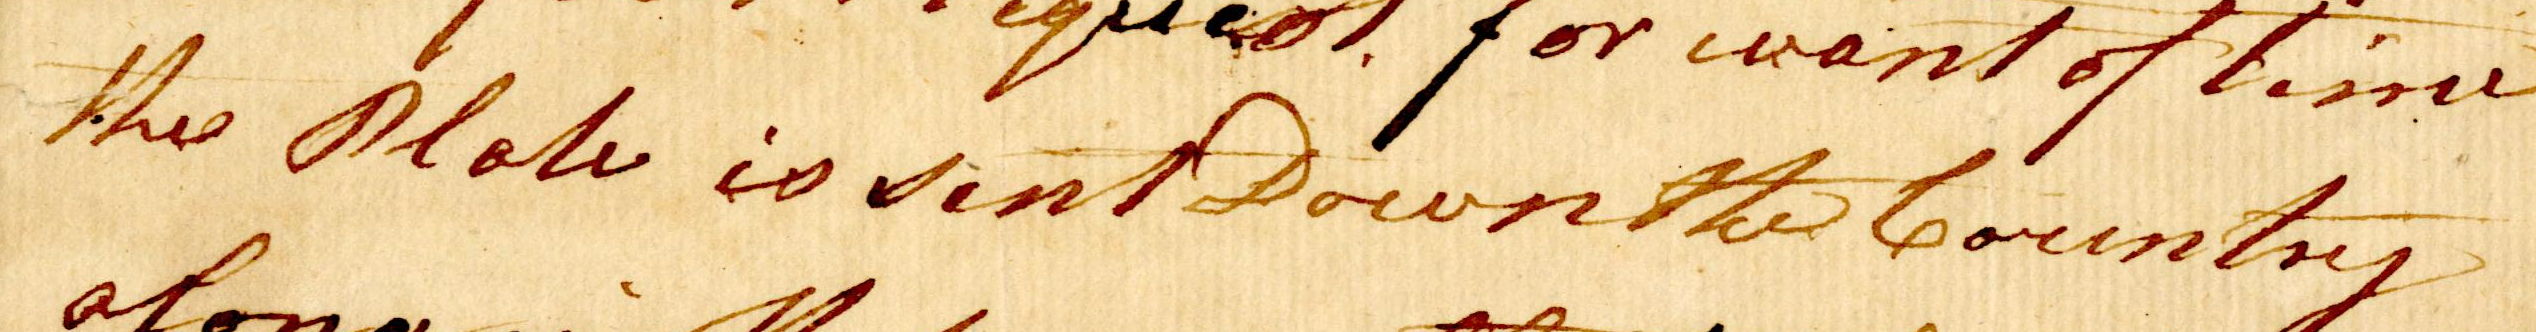the Plate is sent down the Country
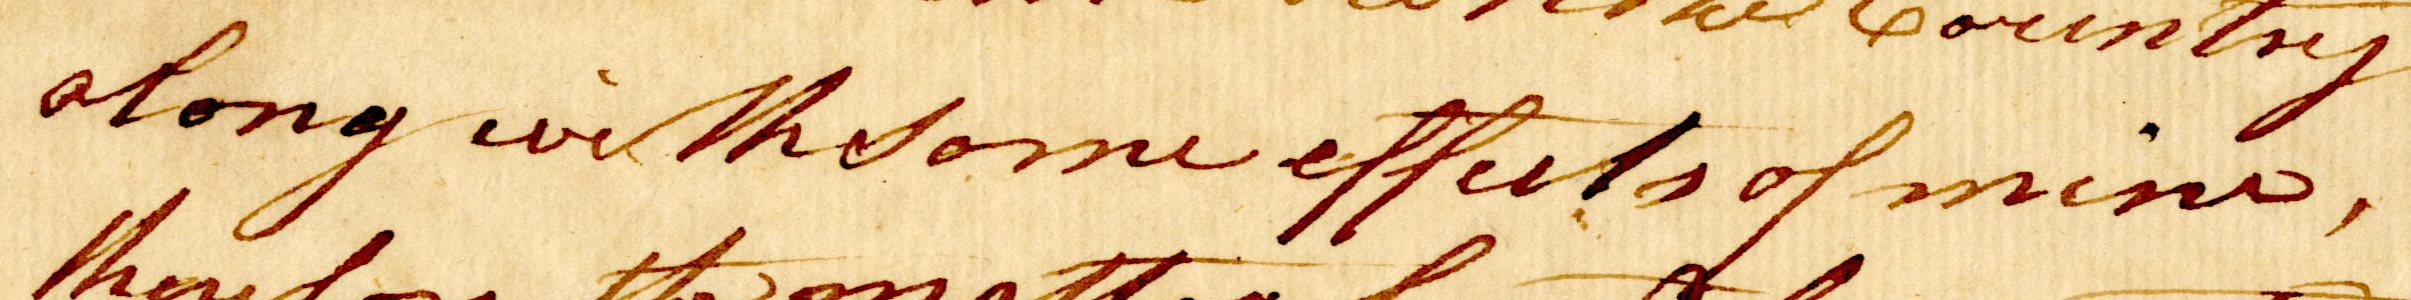along with some effects of mine
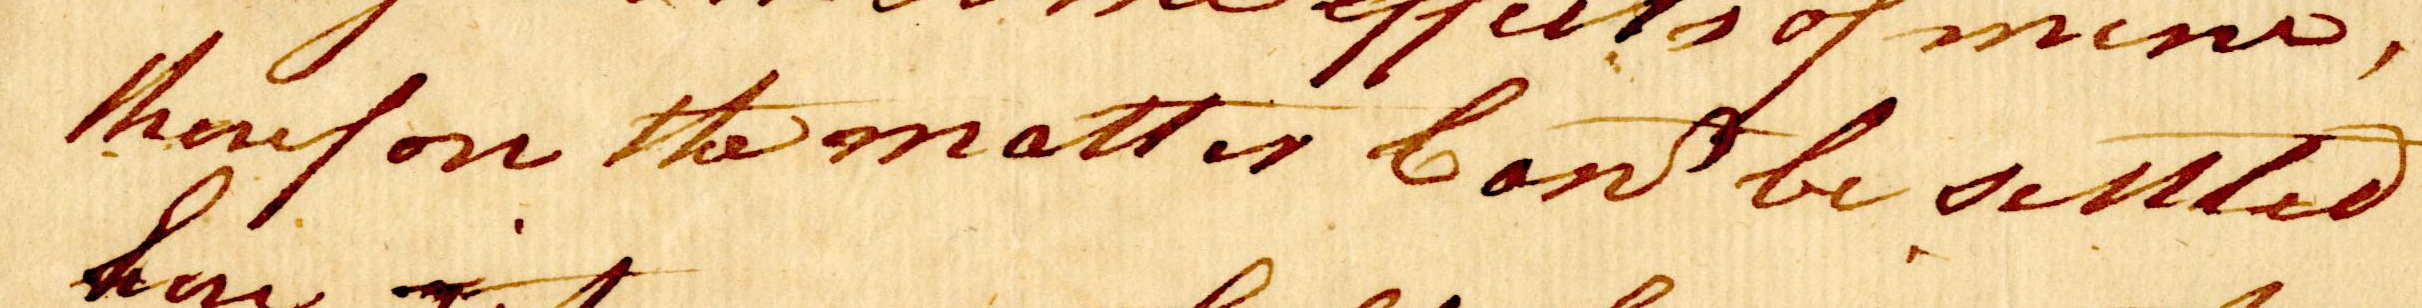therefor the matter Can^t be settled
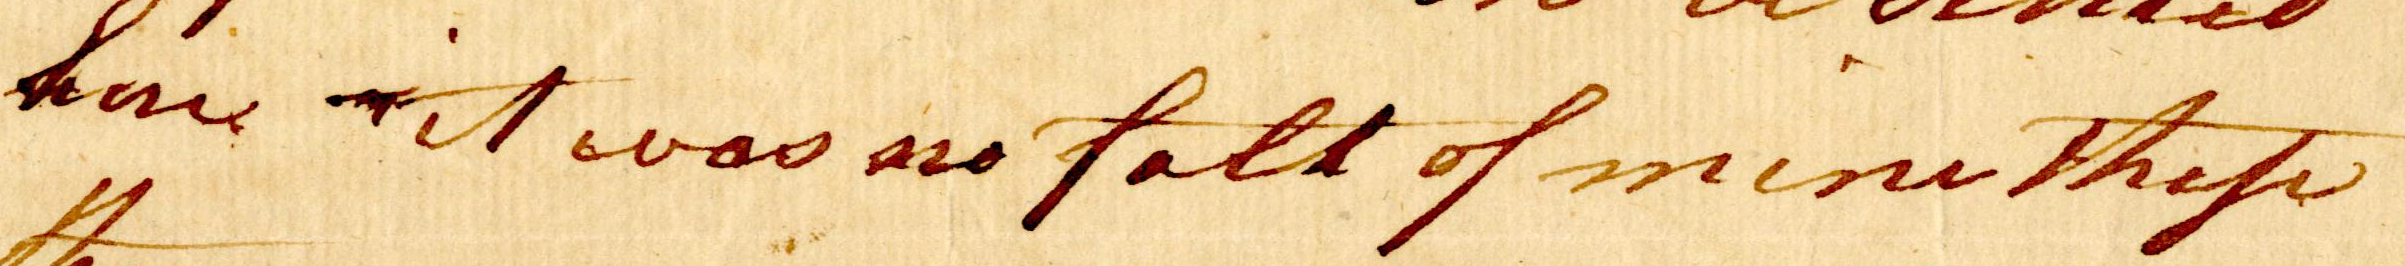here it was no falt of mine these
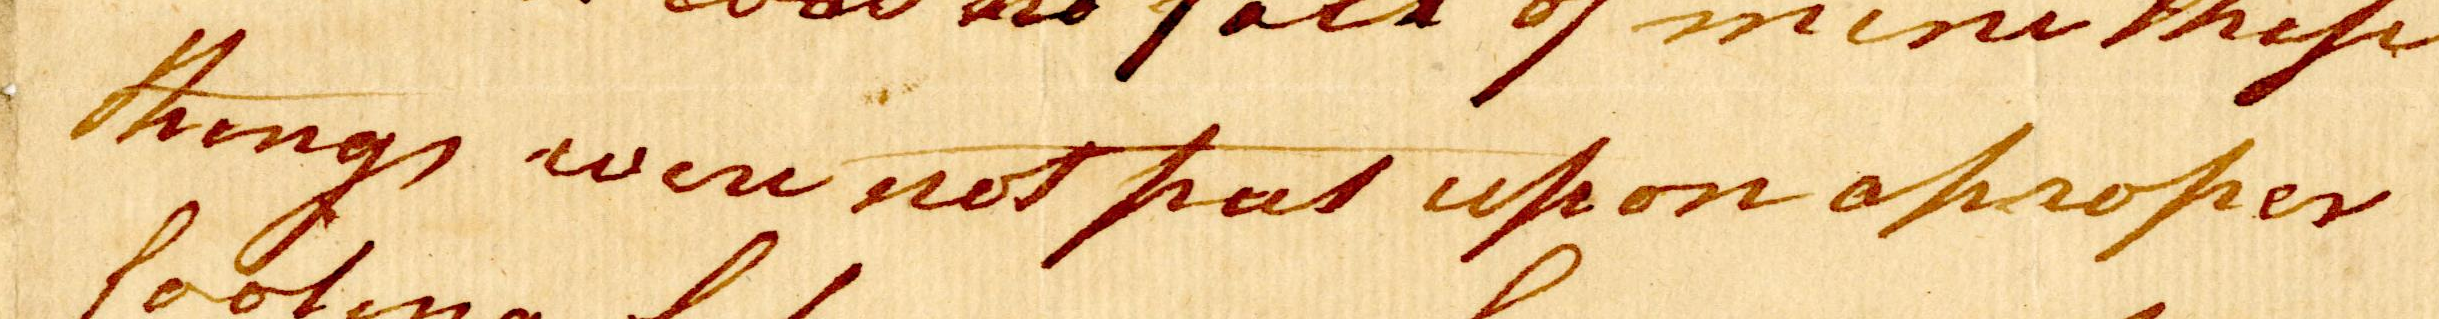things were not put upon a proper
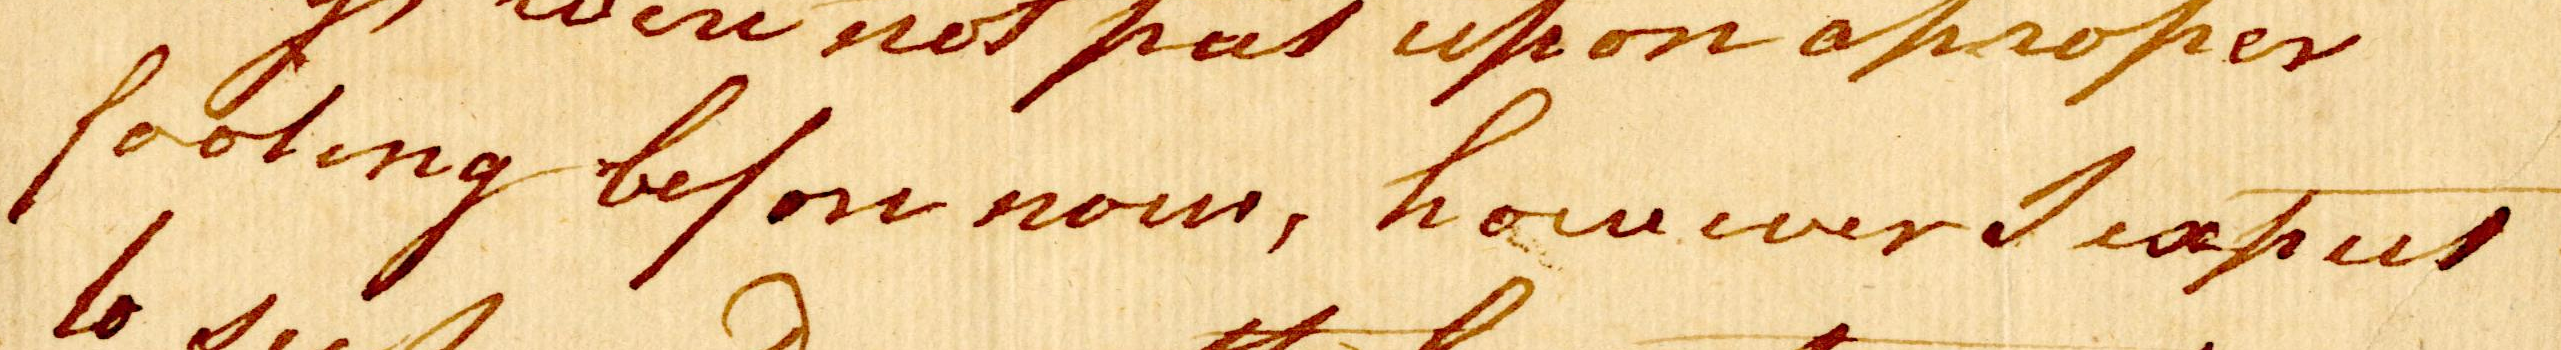footing before now, however I expect
